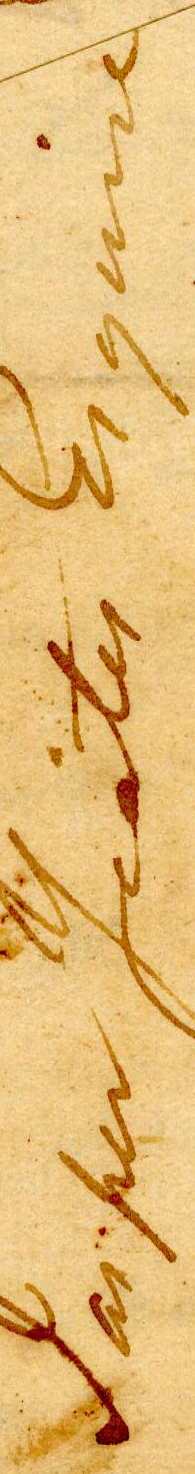Jasper Yeates Esquire
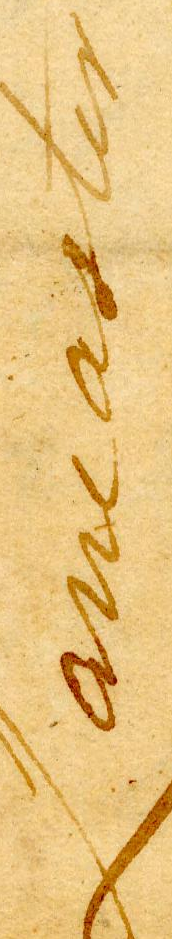Lancaster
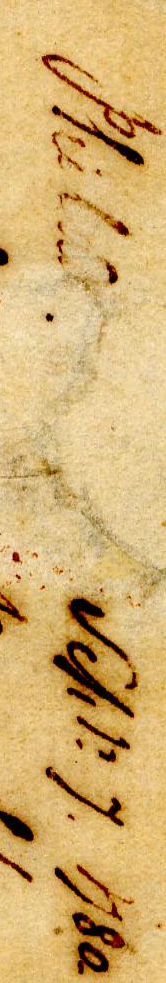Philad. Sept^r. 7. 1780
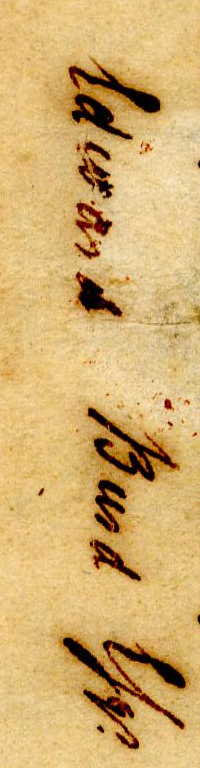Edward Burd Esq^r.
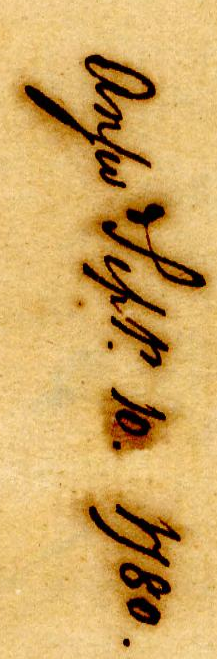Answ^d Sept^r. 10. 1780.
